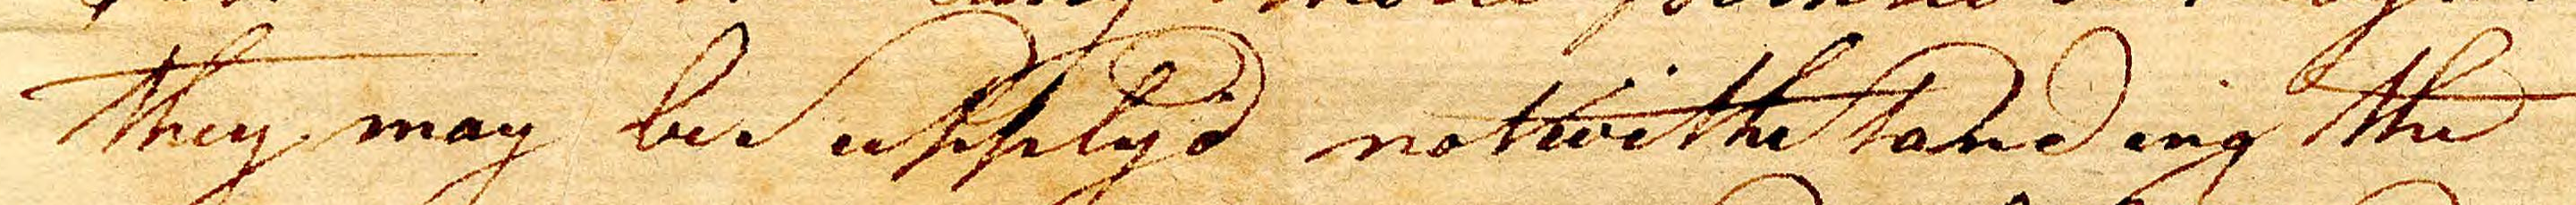they may be Supply'd notwithstanding the
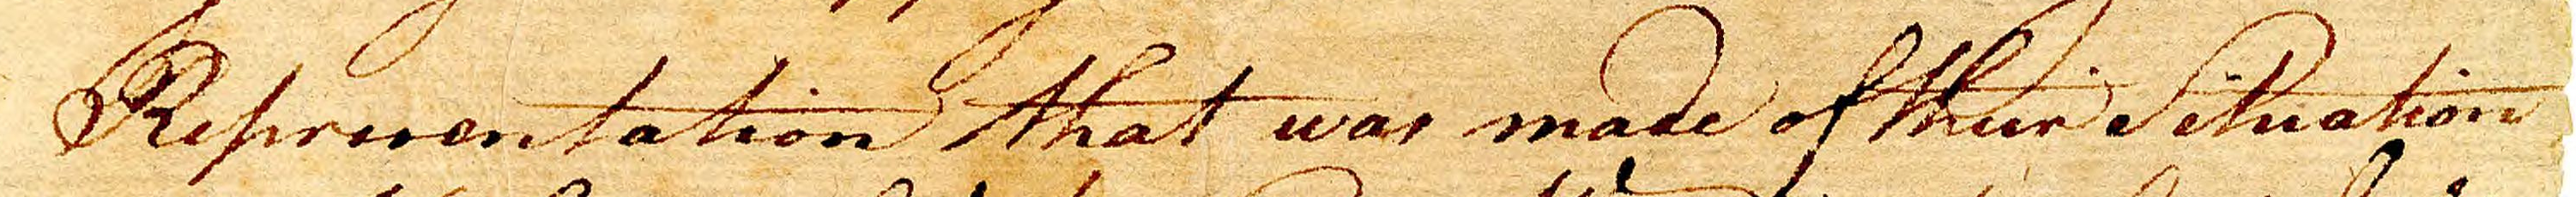Representation that was made of their Situation
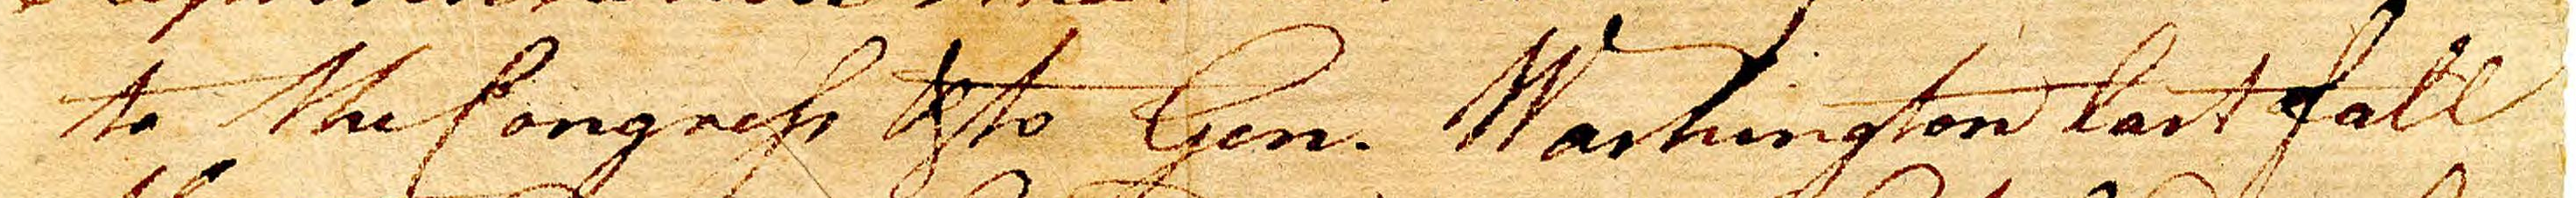to the Congress & to Gen. Washington last fall
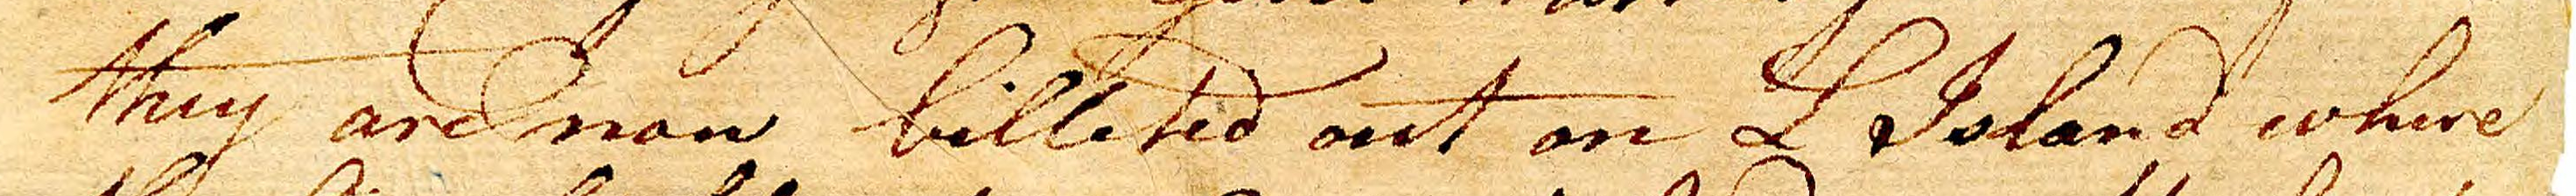they are now billeted out on L Island where
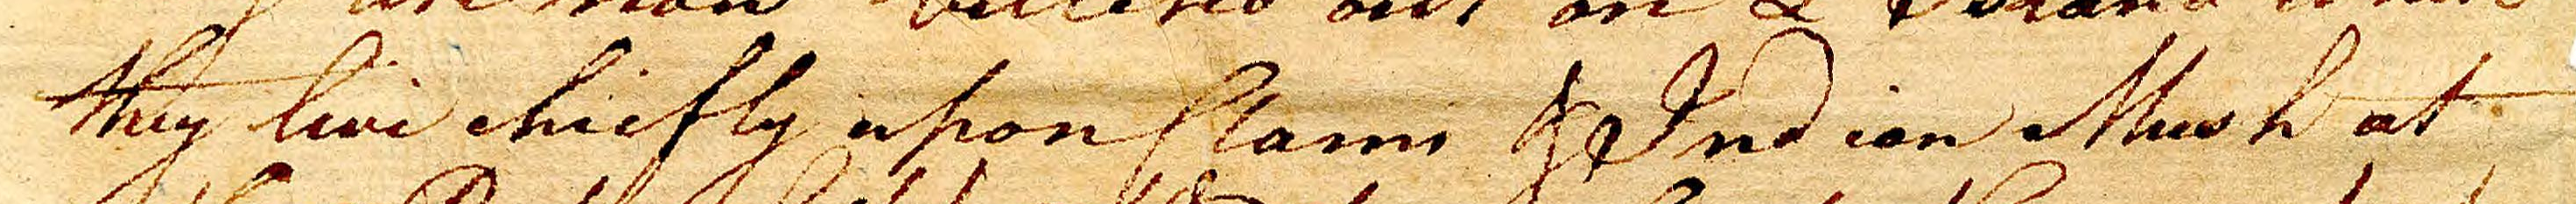they live chiefly upon Clams & Indian Mush at
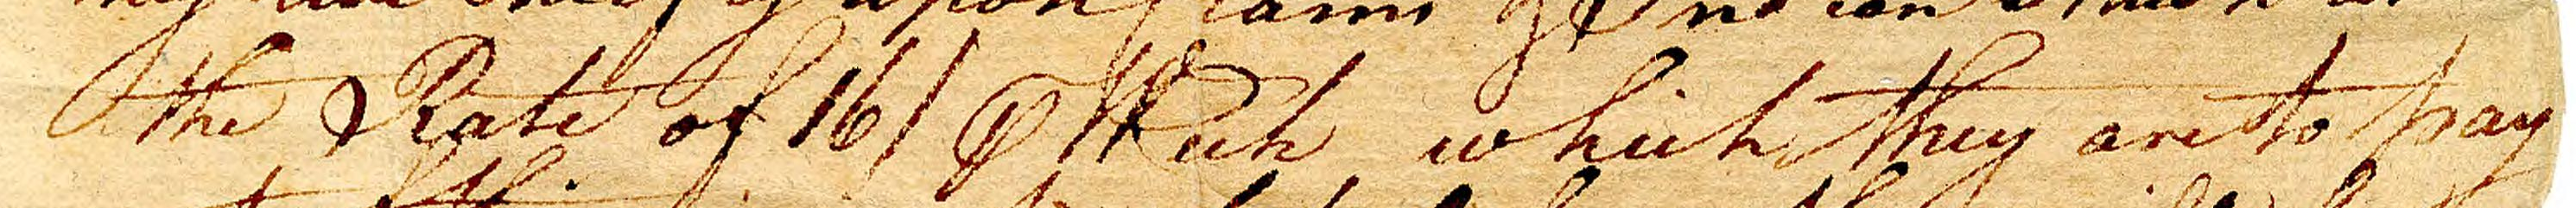the Rate of 16s per Week which they are to pay
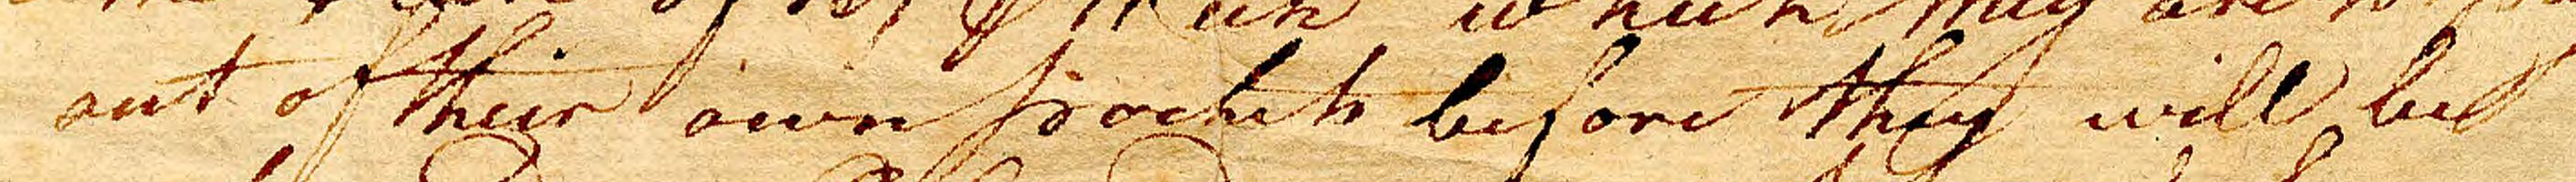out of their own pockets before they will be
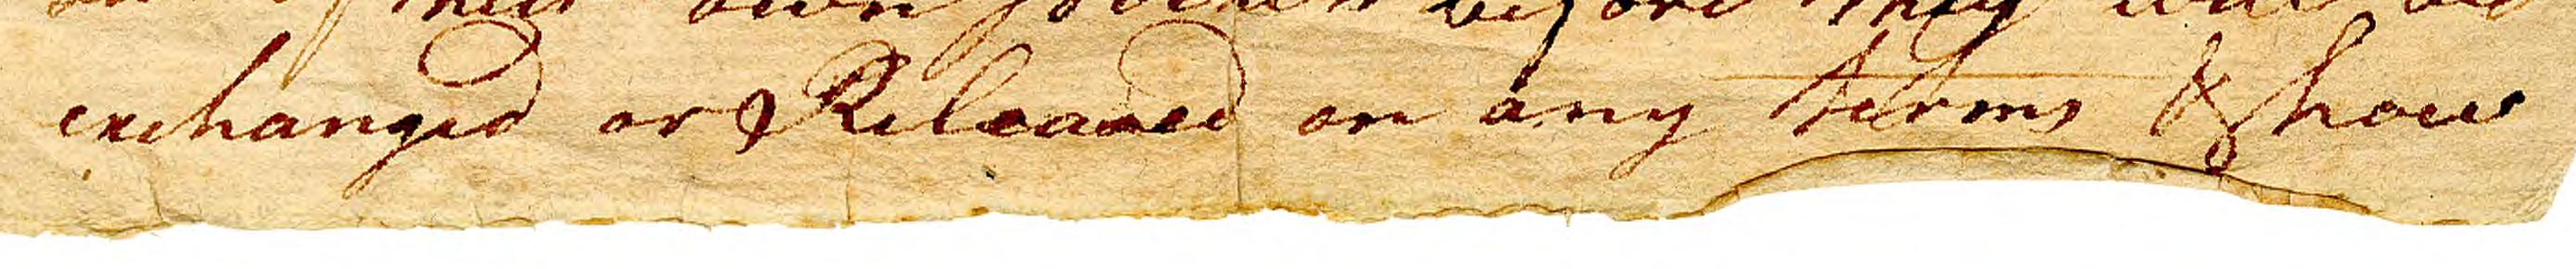exchanged or Released on any terms & how
